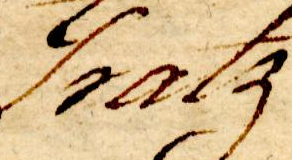Gratz
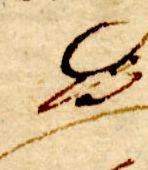&
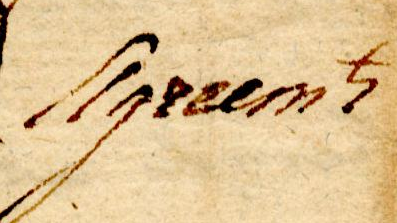Agents
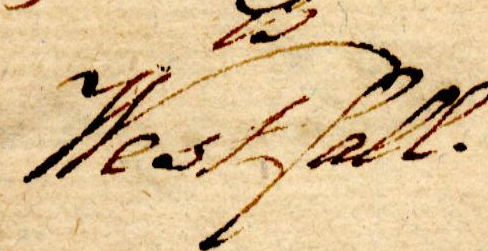Westfall
